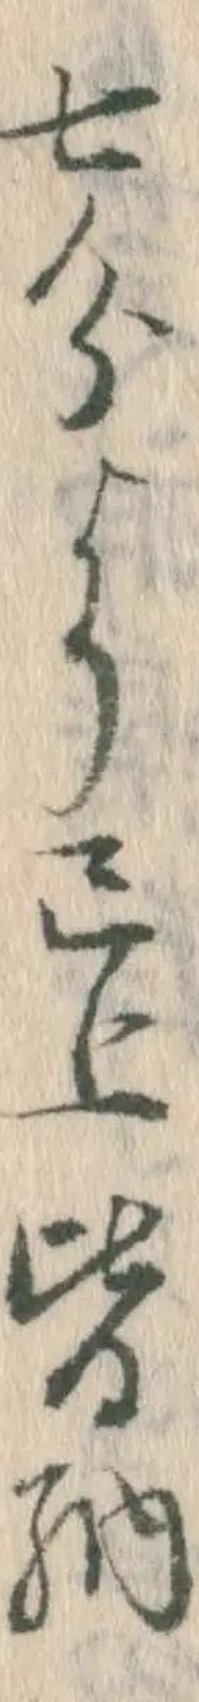七分より已上皆納
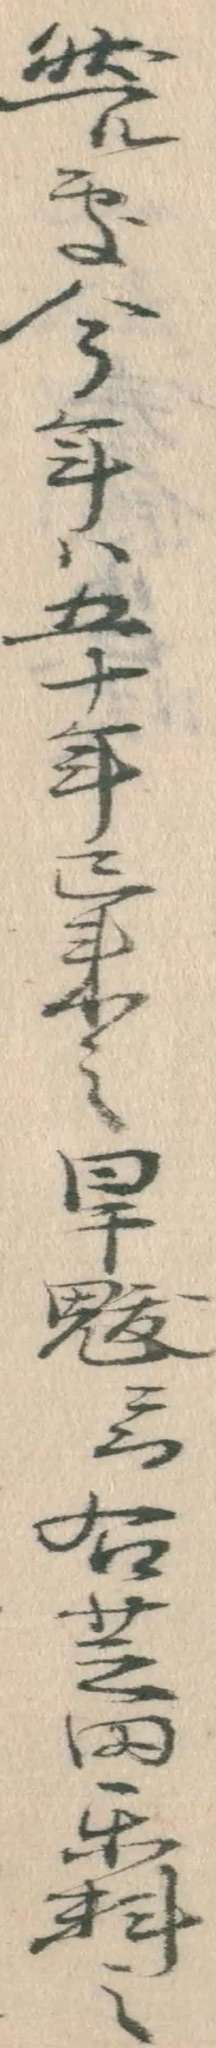然る処今年は五十年已来之旱魃ニ而右芝田楽料之
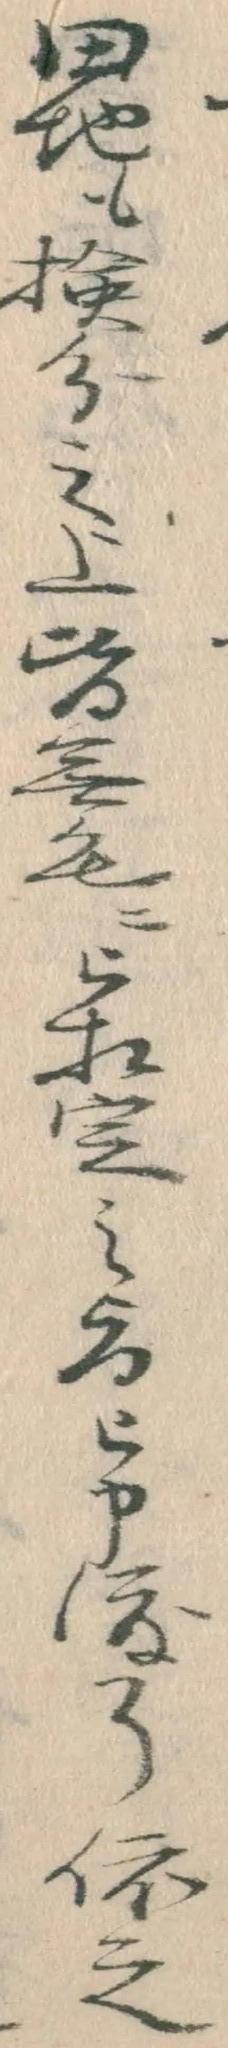田地も検分之上皆無毛に被相定之旨被申渡了依之
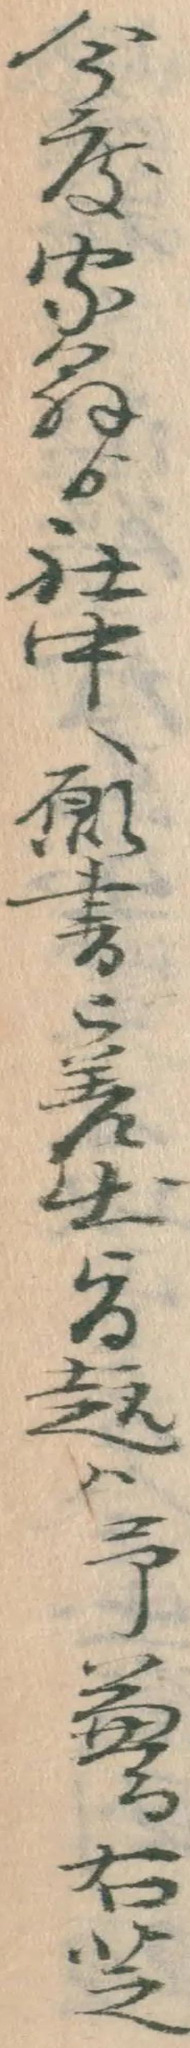今度家翁ゟ社中へ願書被差出旨趣は予兼而右芝

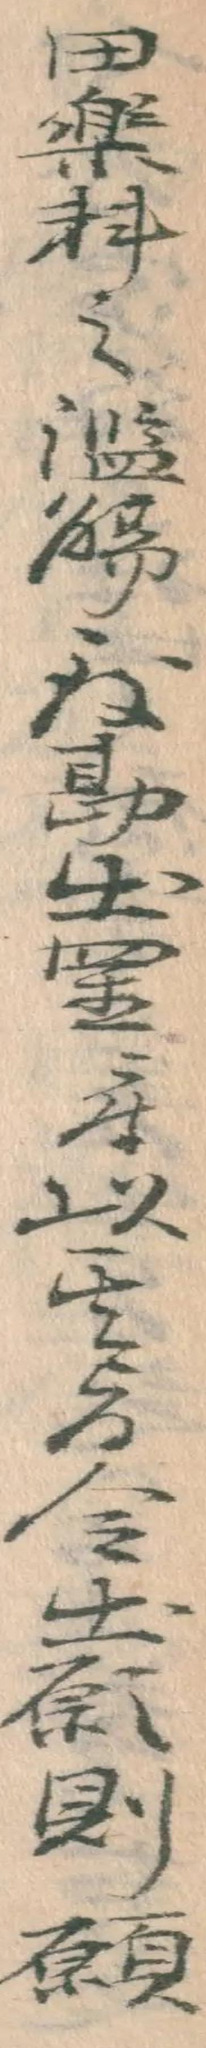田楽料之濫觴致勘出置ニ付以其旨令出願則願
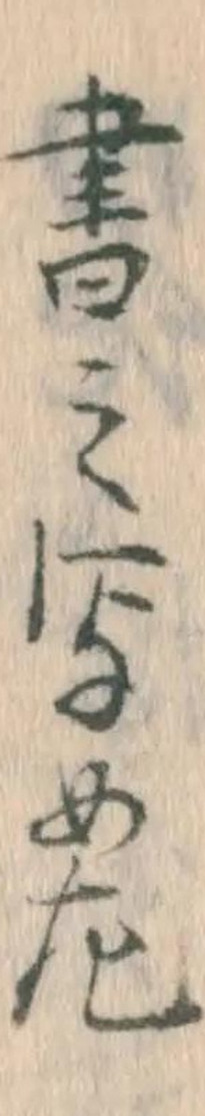書之写如左
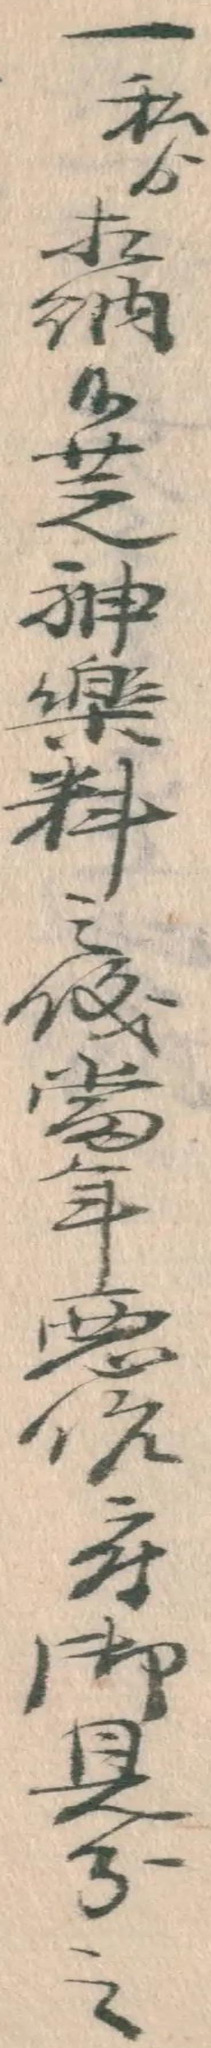一私ゟ相納候芝神楽料之儀当年悪作ニ付御見分之
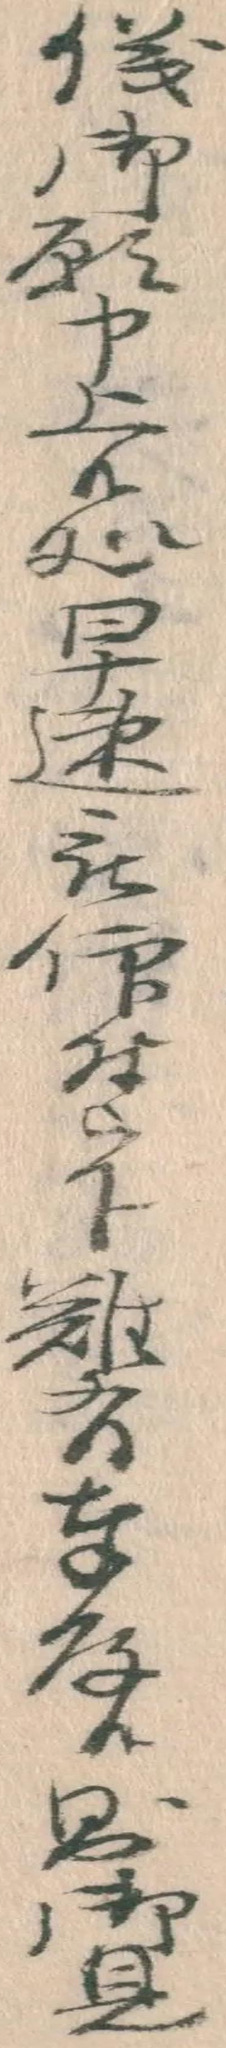儀御願申上候処早速被仰付被下難有奉存候則御見
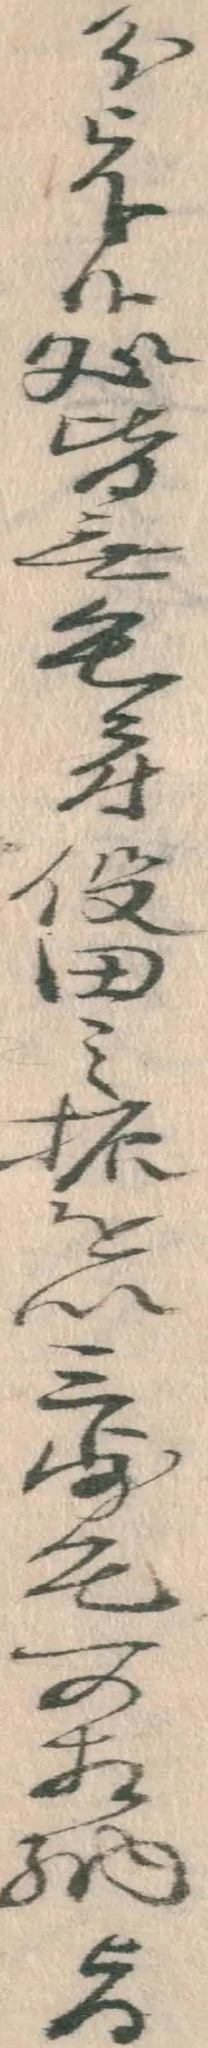分被下候処皆無毛ニ付役田之振を以三歩毛可相納旨
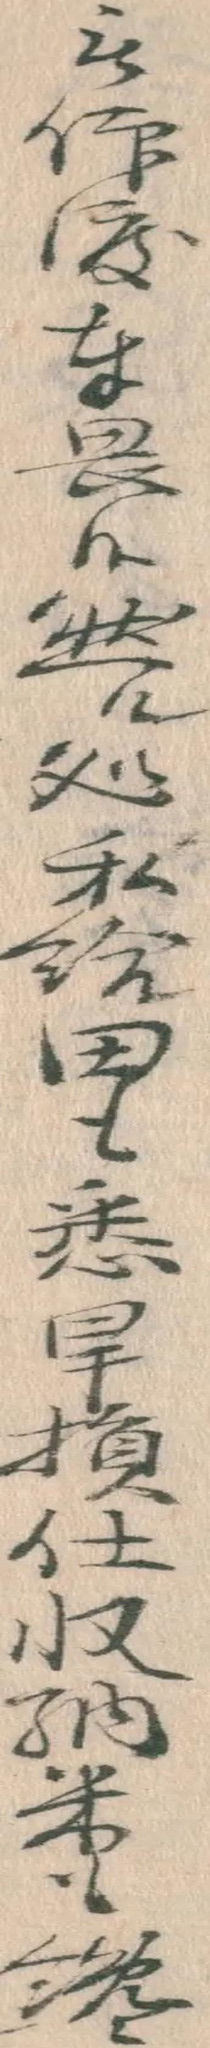被仰渡奉畏候然ル処私給田も悉旱損仕収納米も纔
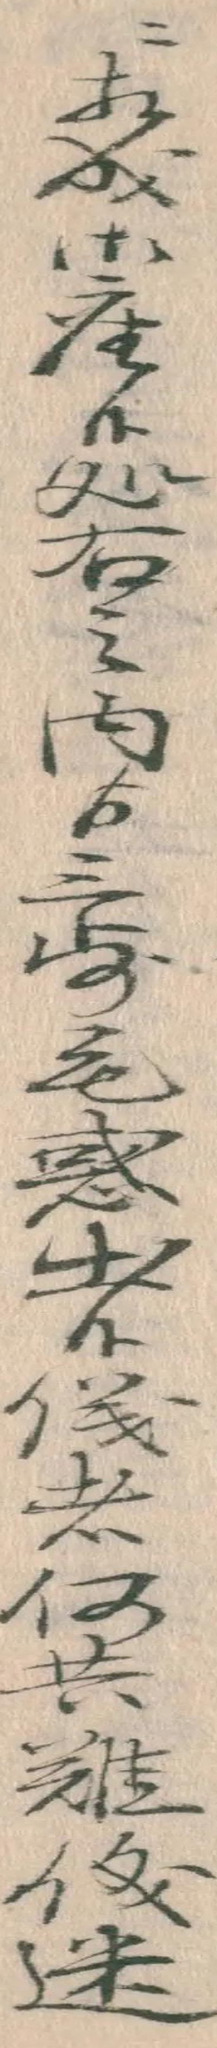ニ相成御座候右之内ゟ三歩毛惑出候儀者何共な難儀迷
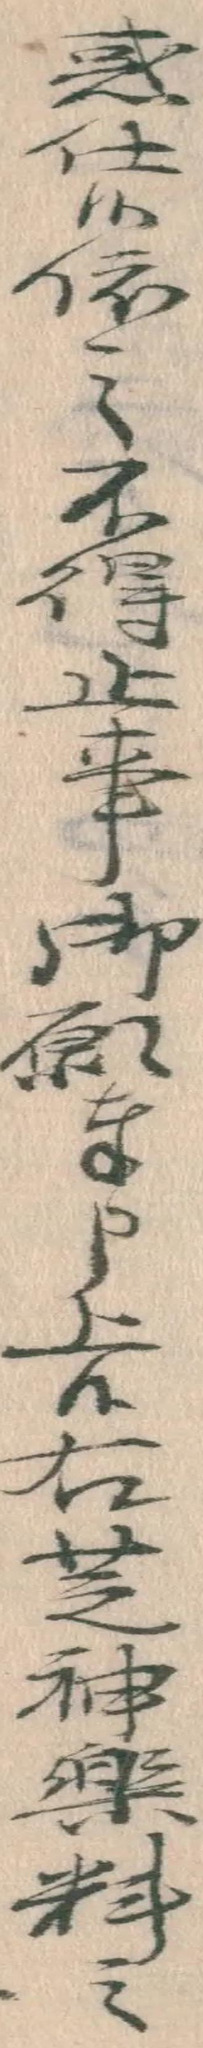惑仕候依之不得止事御願奉申上候右芝神楽料之
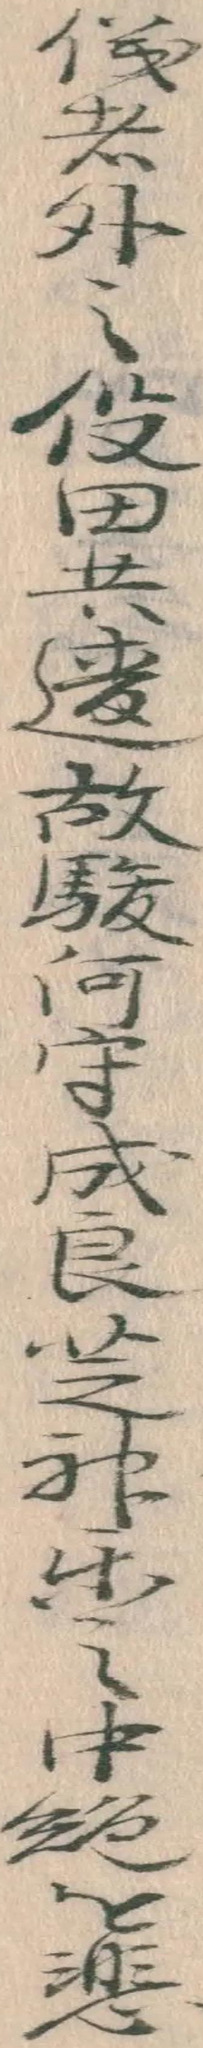儀者外之役田共違故駿河守成良芝神楽之中絶を悲
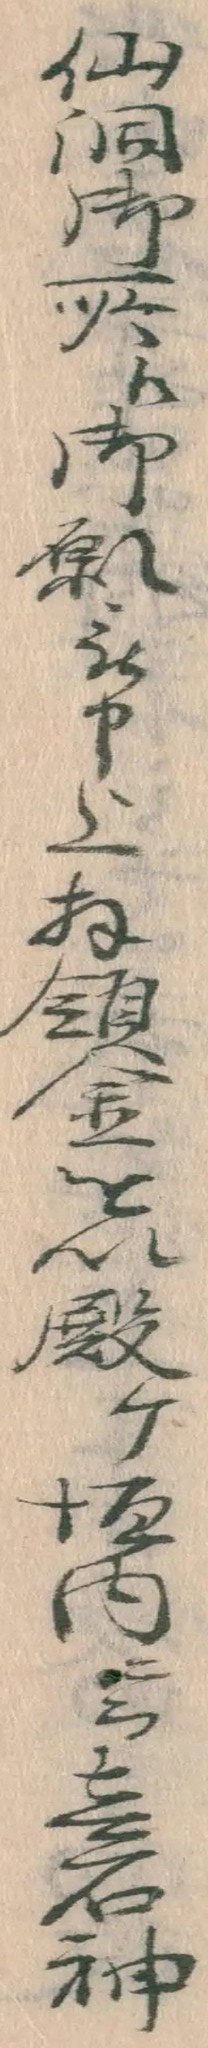仙洞御所江御願被申上拝領金を以殿ヶ垣内ニ而壱石神
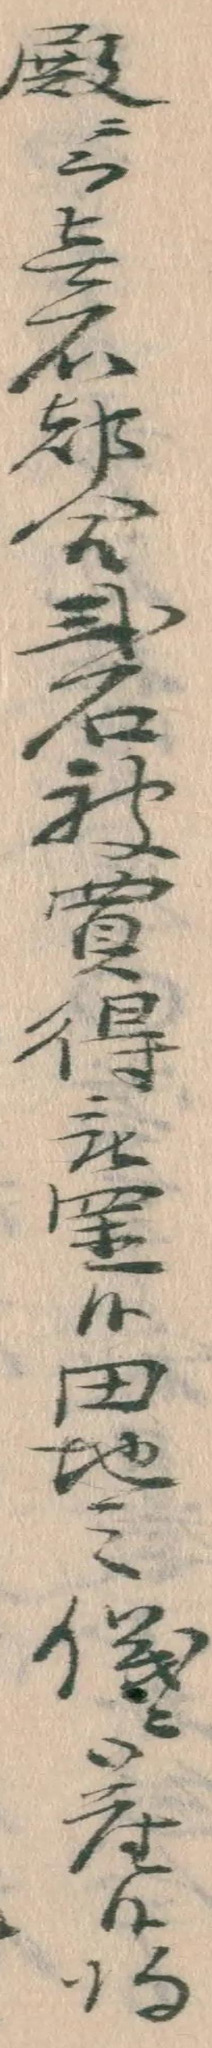殿ニ而壱石都合弐石被買得被置候田地之儀ニ御座候得
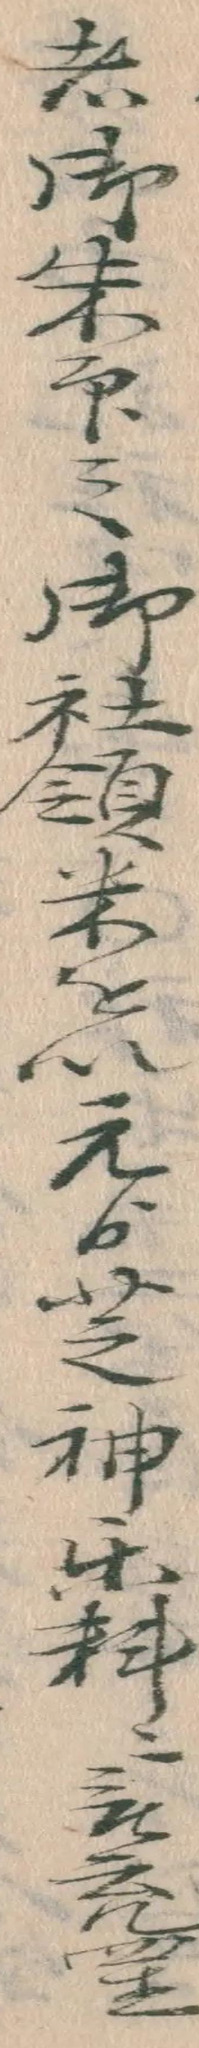者御朱印之御社領米を以元ゟ芝神楽料ニ被充置
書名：賀茂社記録. 第64冊
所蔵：国立国会図書館 National Diet Library, JAPAN
